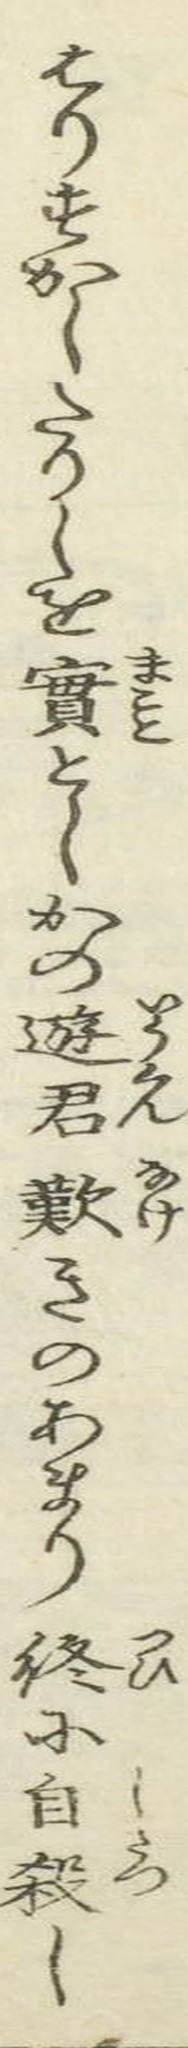はりすかしたりしを実としかの遊君歎きのあまり終に自殺し
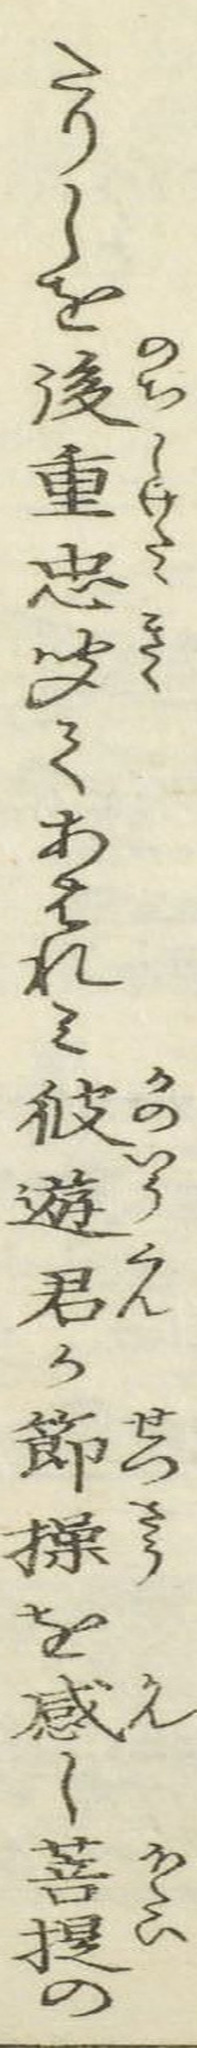たりしを後重忠聞てあはれと彼遊君か節操を感し菩提の
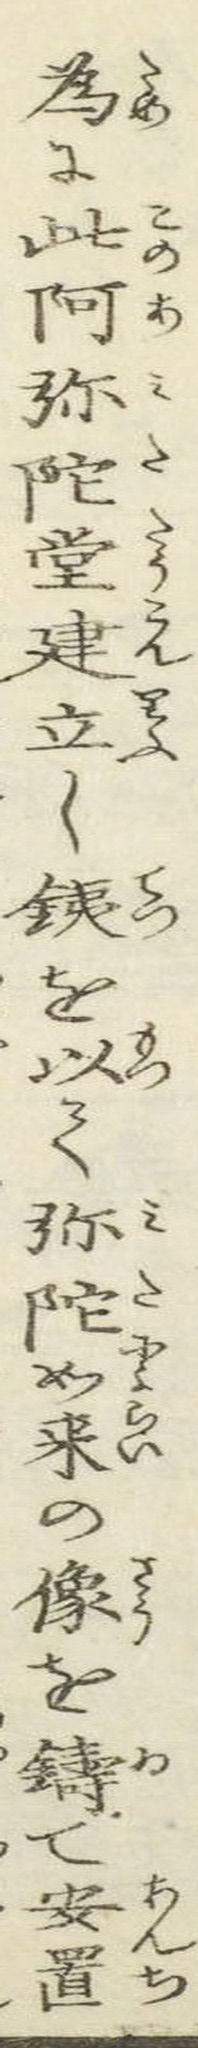為に此阿弥陀堂建立し銕を以て弥陀如来の像を鋳て安置
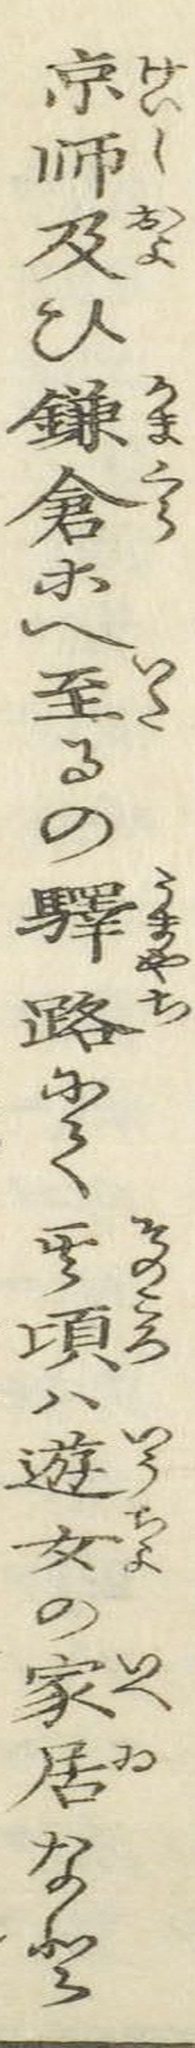京師及ひ鎌倉等へ至るの駅路にて其頃は遊女の家居なと
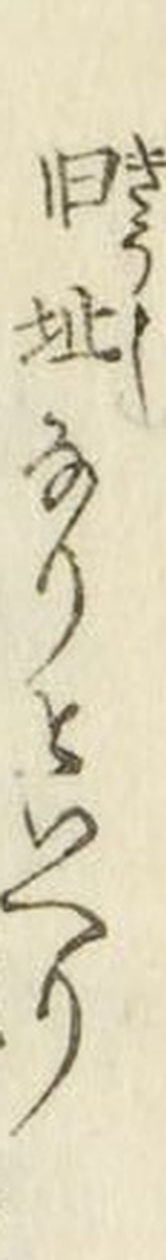旧址なりといへり
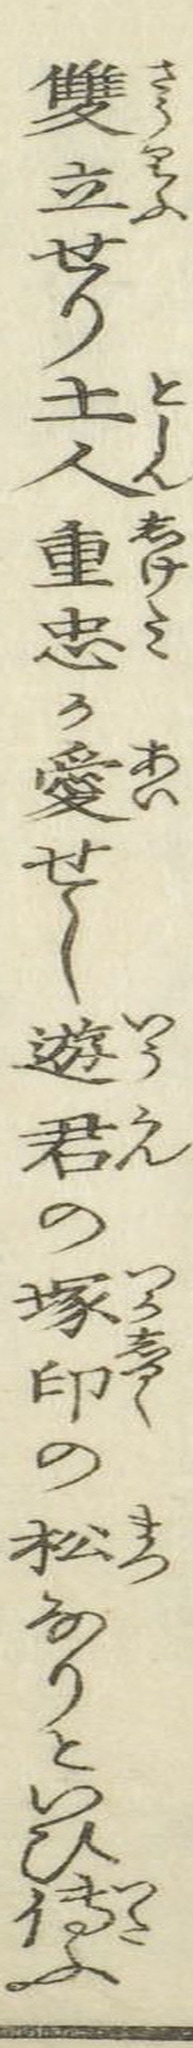雙立せり土人重忠か愛せし遊君の塚印の松なりといひ伝ふ
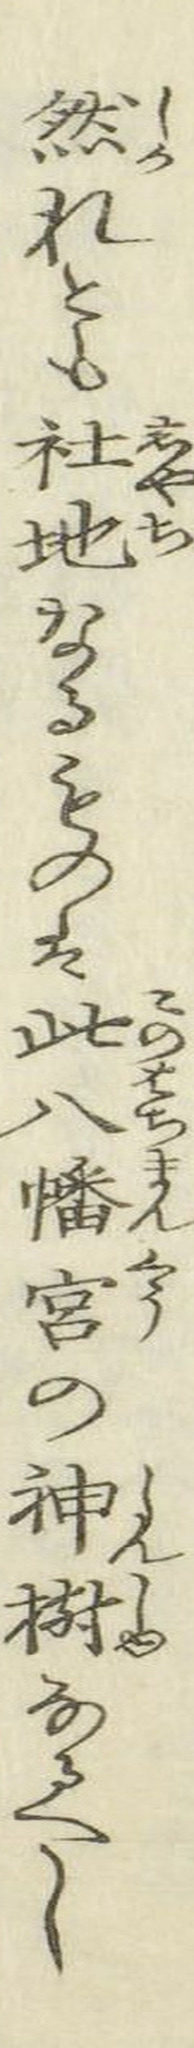然れとも社地なるものは此八幡宮の神樹なるへし
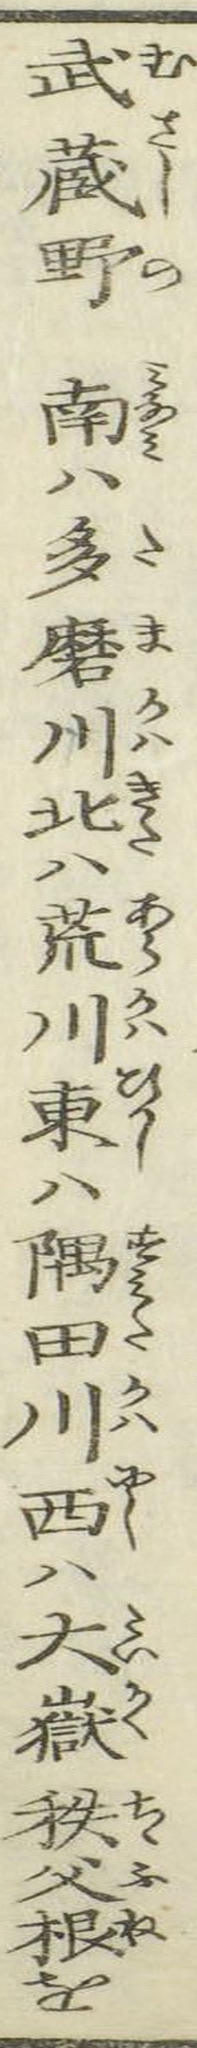武蔵野南は多摩川北は荒川東は隅田川西は大嶽秩父根を
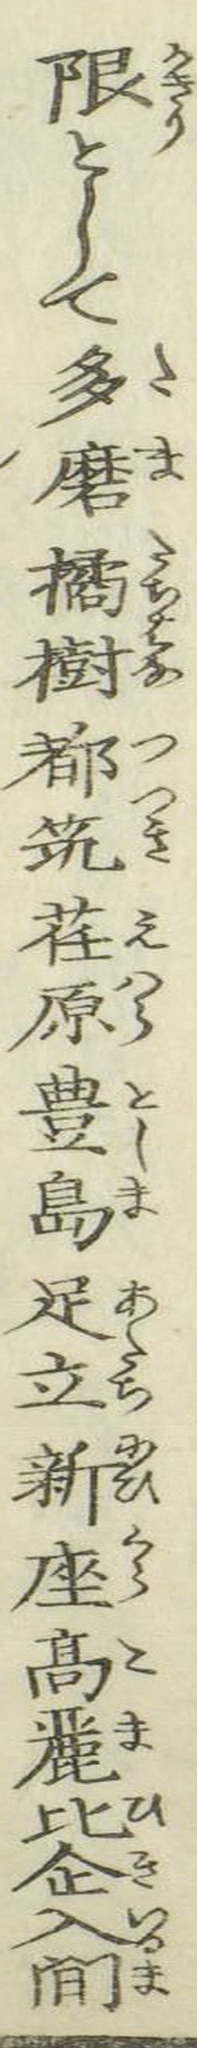限として多磨橘樹都筑荏原豊島足立新座高麗比企入間
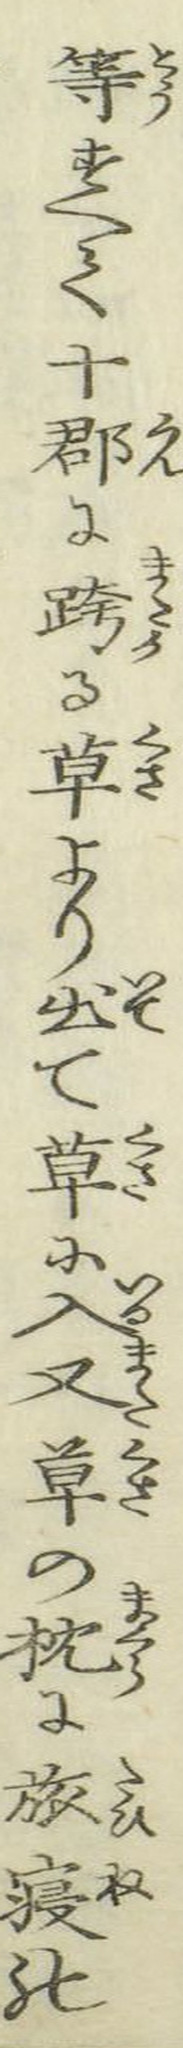等すへて十郡に跨る草より出て草に入又草の枕に旅寝の
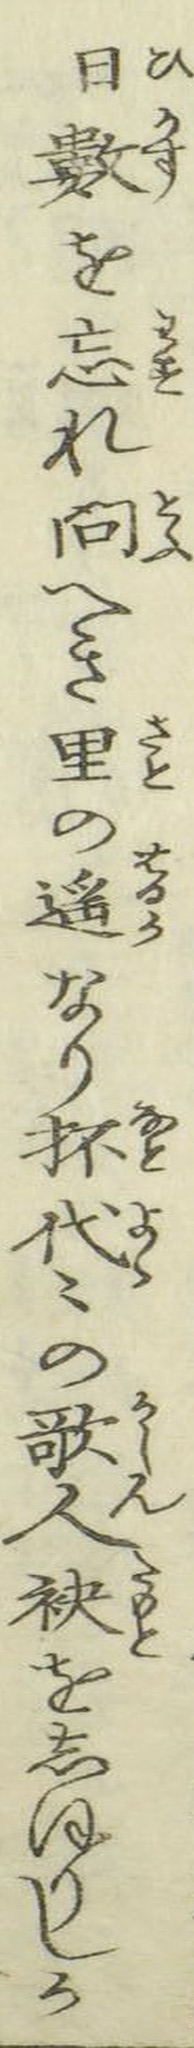日数を忘れ問へき里の遥なり杯代々の哥人袂をしほりしか

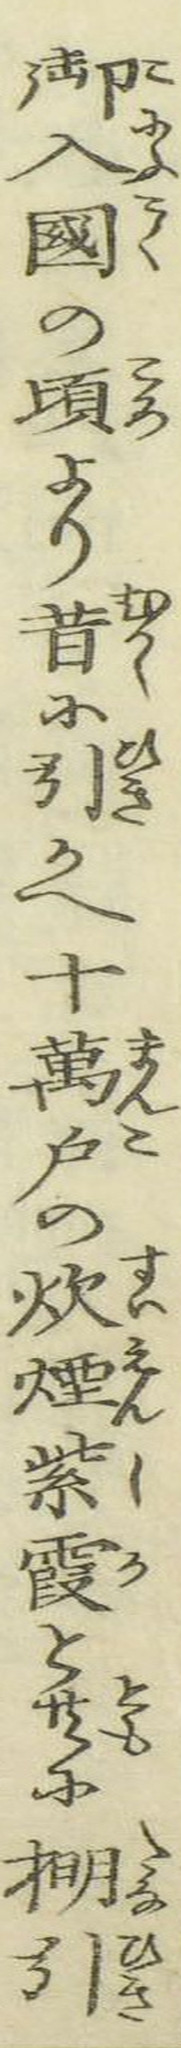御入国の頃より昔に引かへ十萬戸の炊煙紫霞と共に棚引
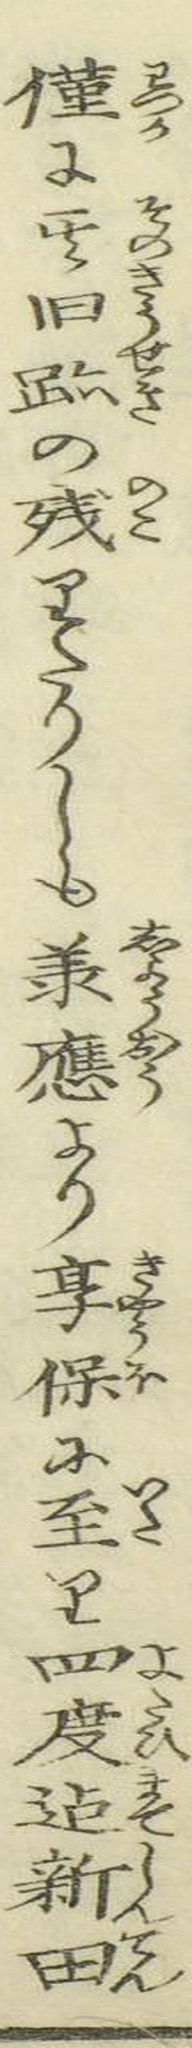僅に其旧跡の残りたりしも承応より享保に至り四度迠新田
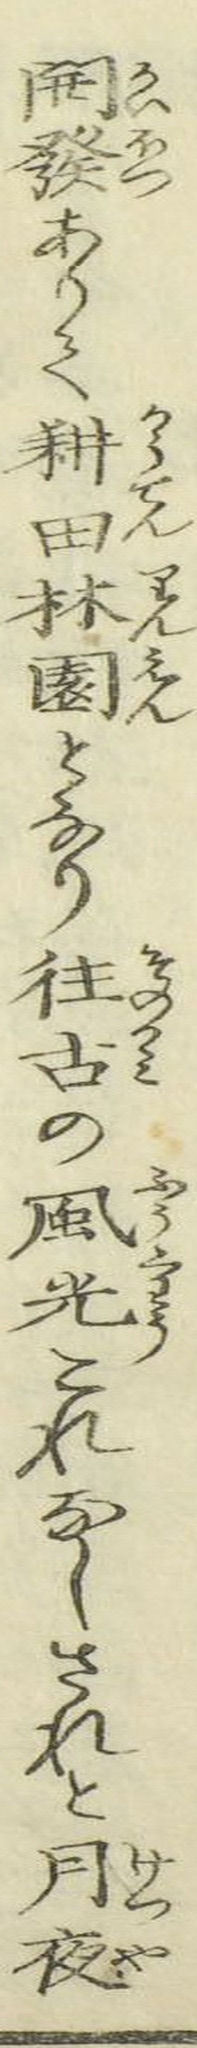開発ありて耕田林園となり往古の風光これなしされと月夜
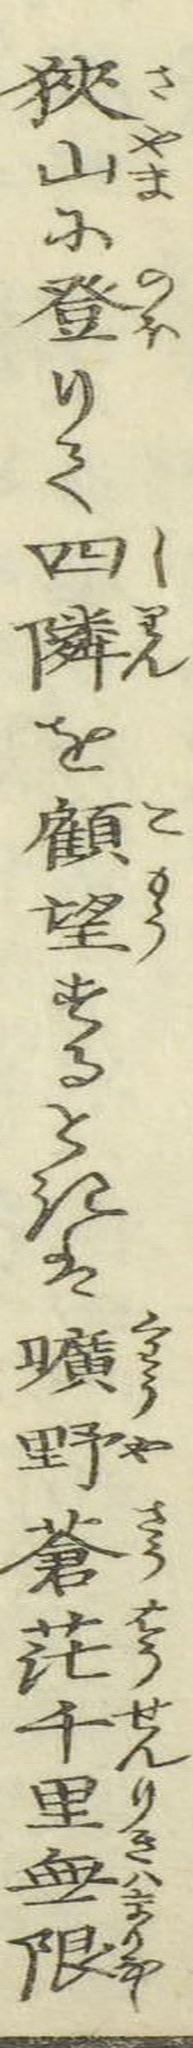狭山に登りて四隣を顧望するときは嚝野蒼茫千里無限
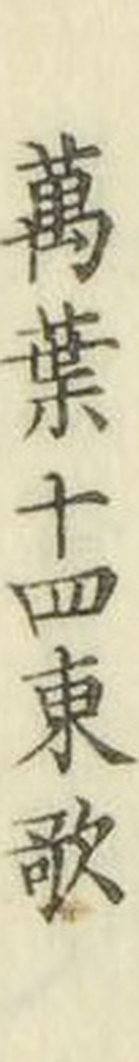万葉十四東歌
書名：江戸名所図会 20巻 巻之9
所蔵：東京学芸大学教育コンテンツアーカイブ
